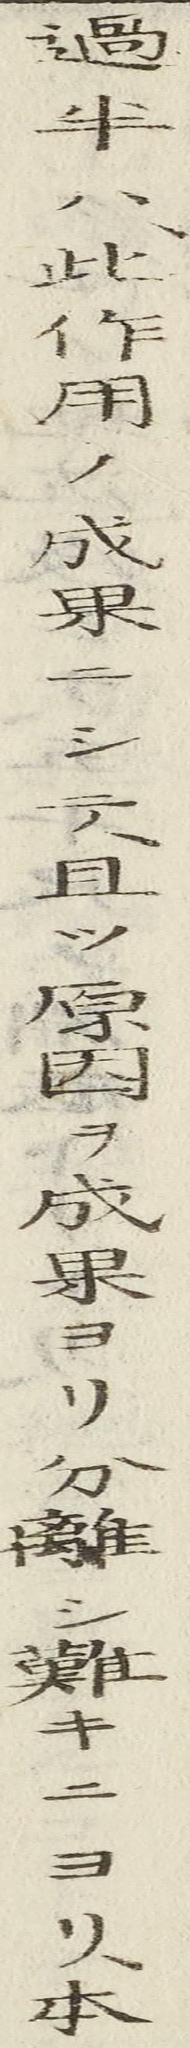過半ハ、此作用ノ成果ニシテ、且ツ原因ヲ成果ヨリ分離シ難キニヨリ、本
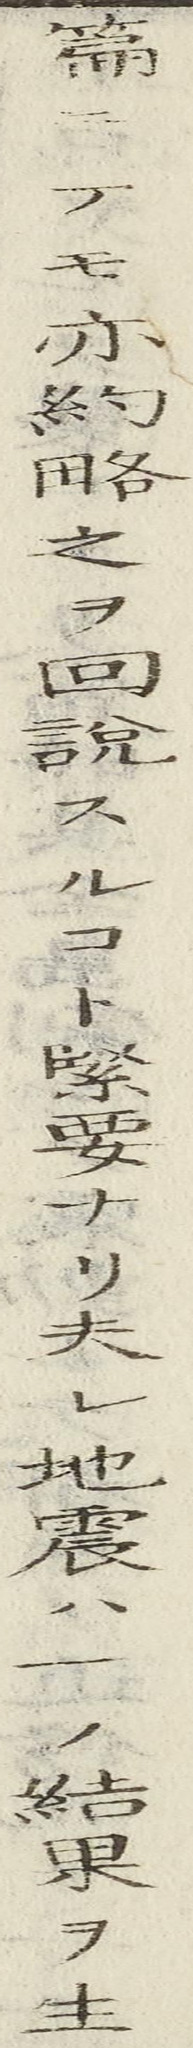篇ニテモ亦約略之ヲ回説スルコト緊要ナリ夫レ地震ハ一ノ結果ヲ生
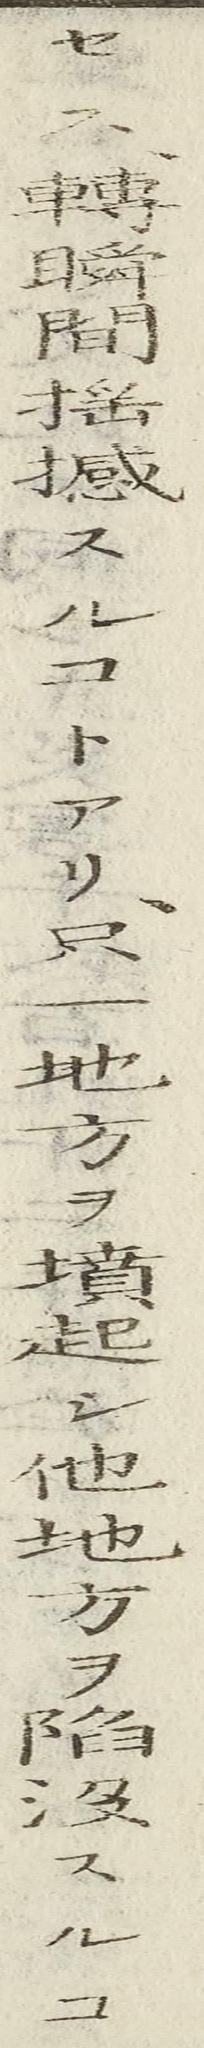セス、転瞬間揺撼スルコトアリ、只一地方ヲ墳起シ他地方ヲ陥没スルコ
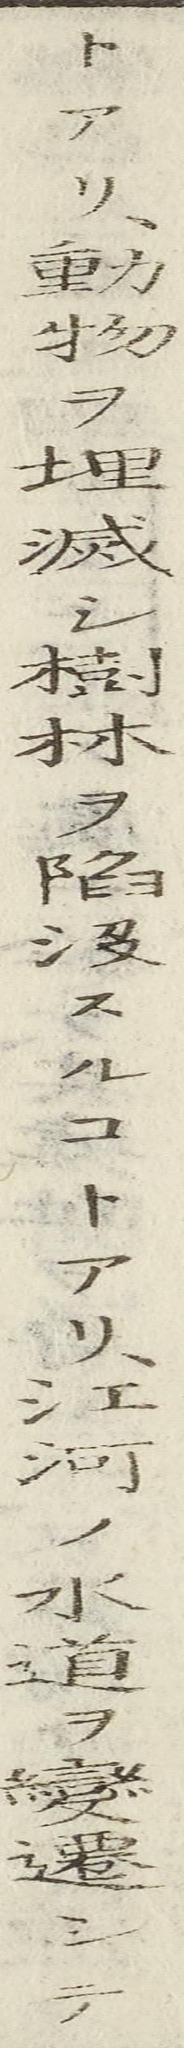トアリ、動物ヲ埋滅シ樹林ヲ陥没スルコトアリ、江河ノ水道ヲ変遷シテ
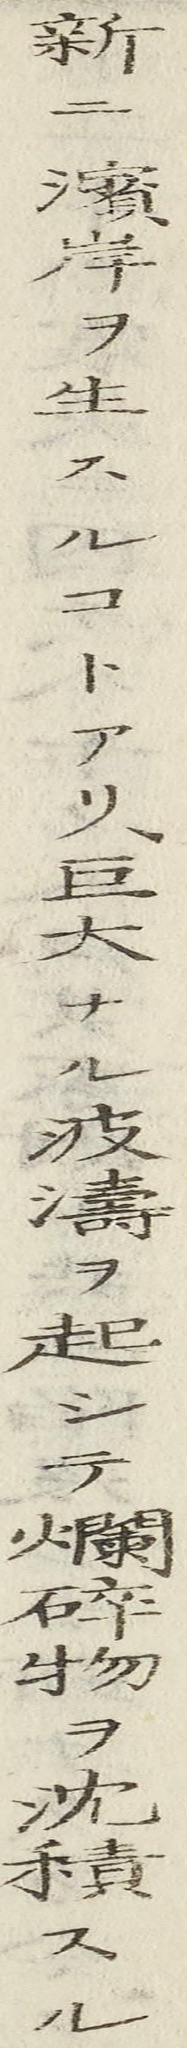新ニ浜岸ヲ生スルコトアリ、巨大ナル波濤ヲ起シテ爛砕物ヲ沈積スル
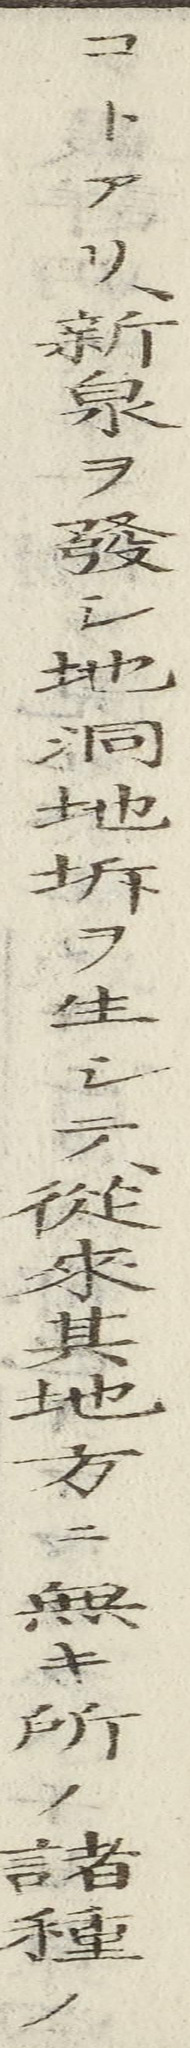コトアリ、新泉ヲ発シ地洞地坼ヲ生シテ、従来其地方ニ無キ所ノ諸種ノ
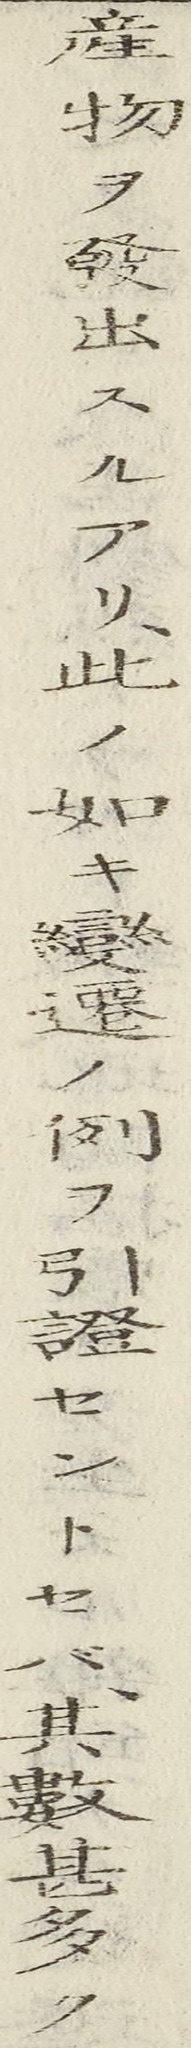産物ヲ発出スルアリ、此ノ如キ変遷ノ例ヲ引証セントセバ、其数甚多ク
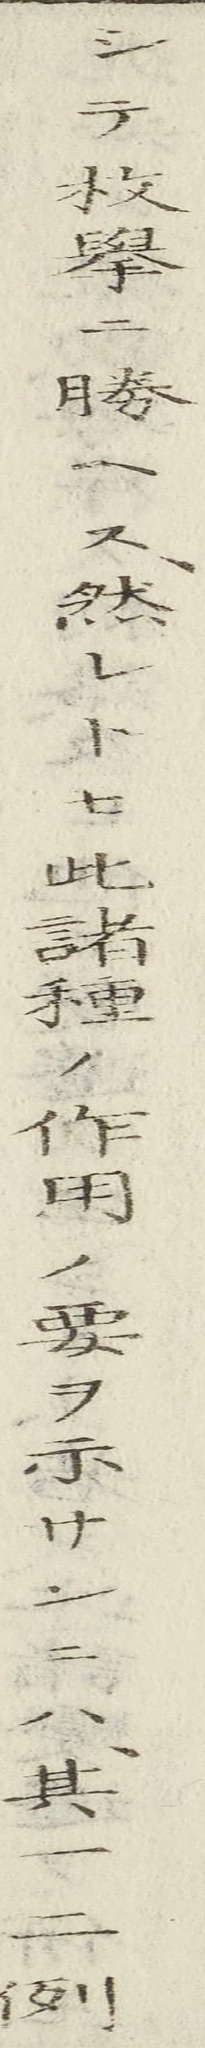シテ枚挙ニ勝ヘス、然レトモ此諸種ノ作用ノ要ヲ示サンニハ、其一二例
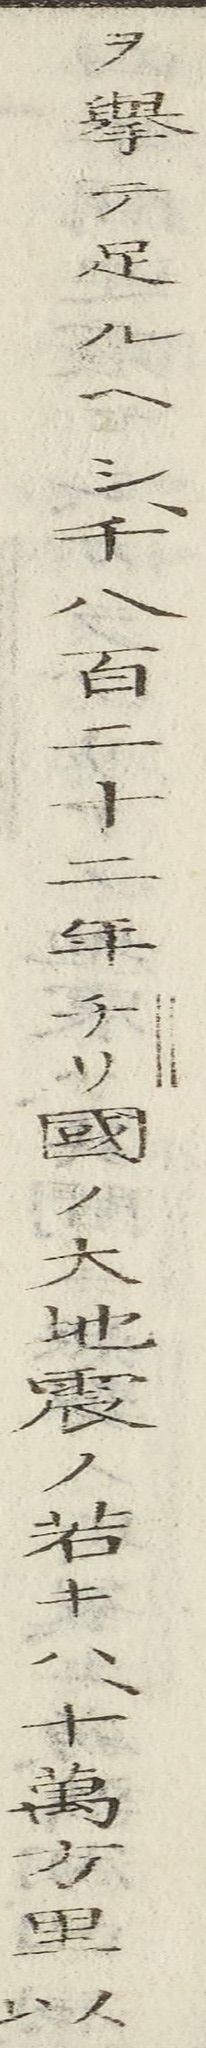ヲ挙テ足ルヘシ、千八百二十二年チリ国ノ大地震ノ若キハ、十万方里以
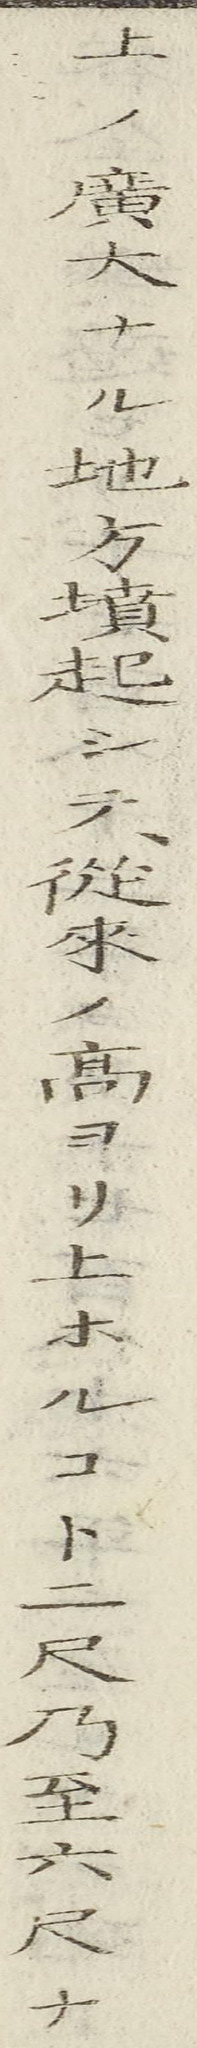上ノ広大ナル地方墳起シテ、従来ノ高ヨリ上ホルコト二尺乃至六尺ナ
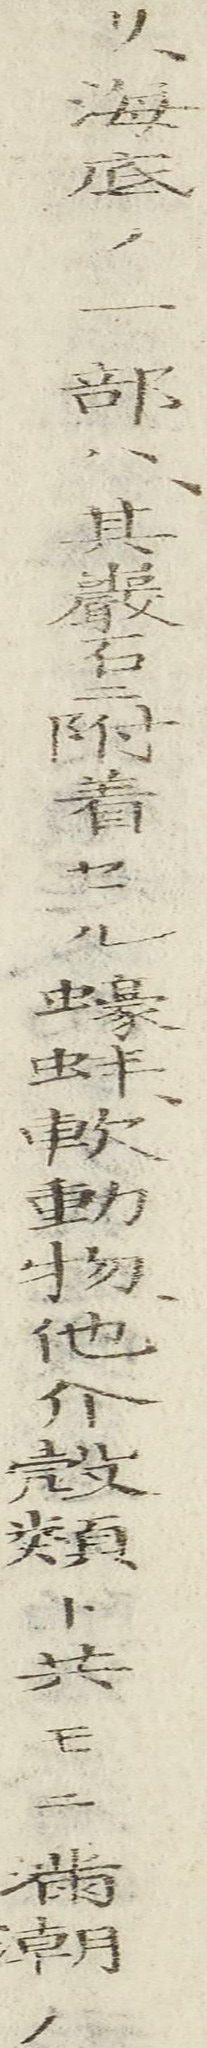リ、海底ノ一部ハ、其厳石ニ附着セル蠔蚌、軟動物、他介殻類ト共モニ満潮ノ
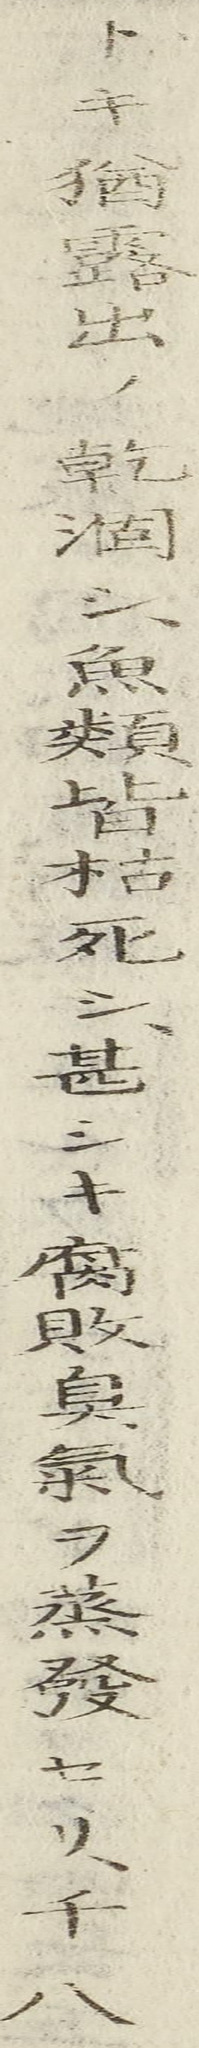トキ猶露出ノ乾涸シ、魚類皆枯死シ、甚シキ腐敗臭気ヲ蒸発セリ、千八

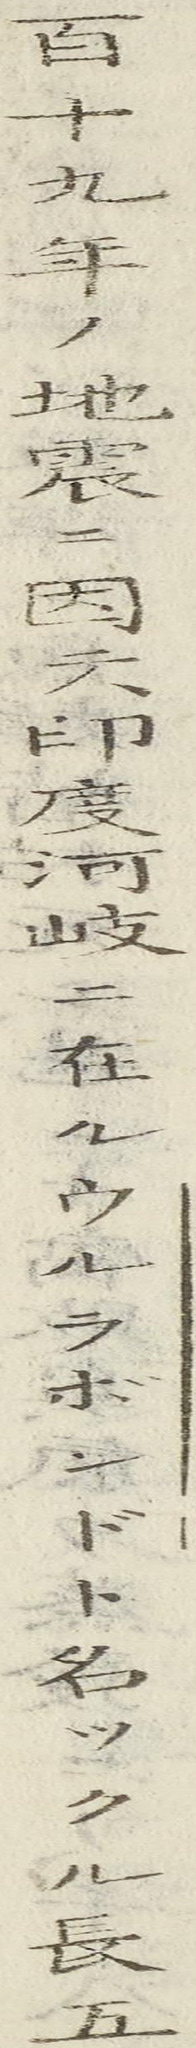百十九年ノ地震ニ因テ、印度河岐ニ在ルウルラボンドト名ツクル長五
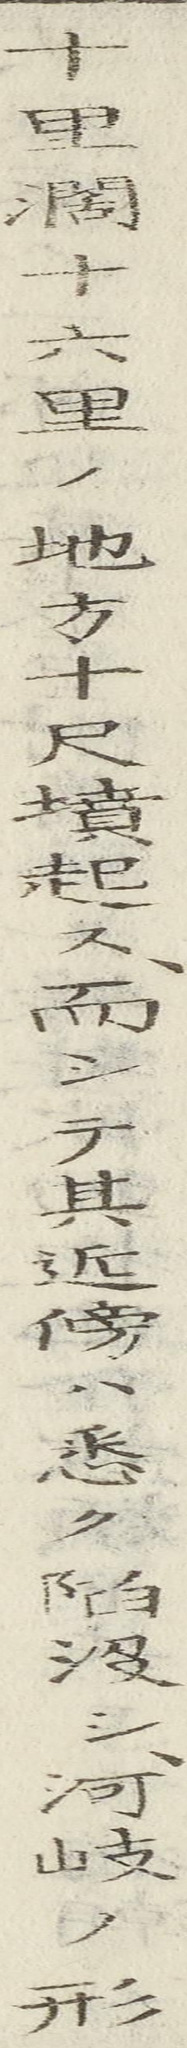十里濶十六里ノ地方十尺墳起ス、而シテ其近傍ハ悉ク陥没シ、河岐ノ形
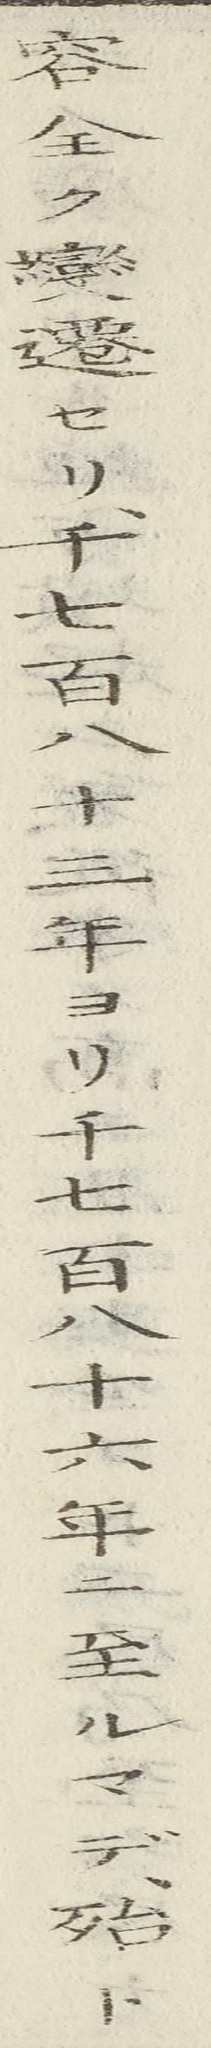容全ク変遷セリ、千七百八十三年ヨリ千七百八十六年ニ至ルマデ、殆ト
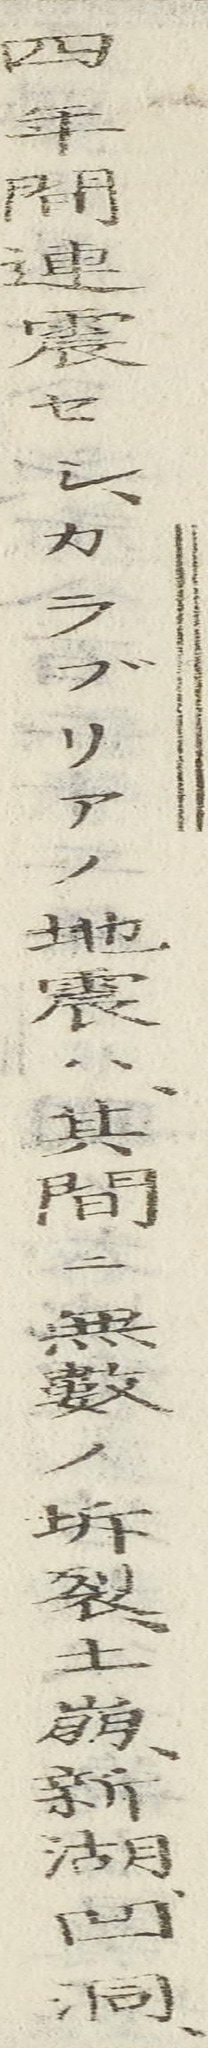四年間連震セシ、カラブリアノ地震ハ、其間ニ無数ノ坼裂、土崩、新湖、凹洞、
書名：百科全書　地文學　全
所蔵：東京大学地震研究所図書室 Earthquake Research Institute Library, The University of Tokyo, JAPAN
